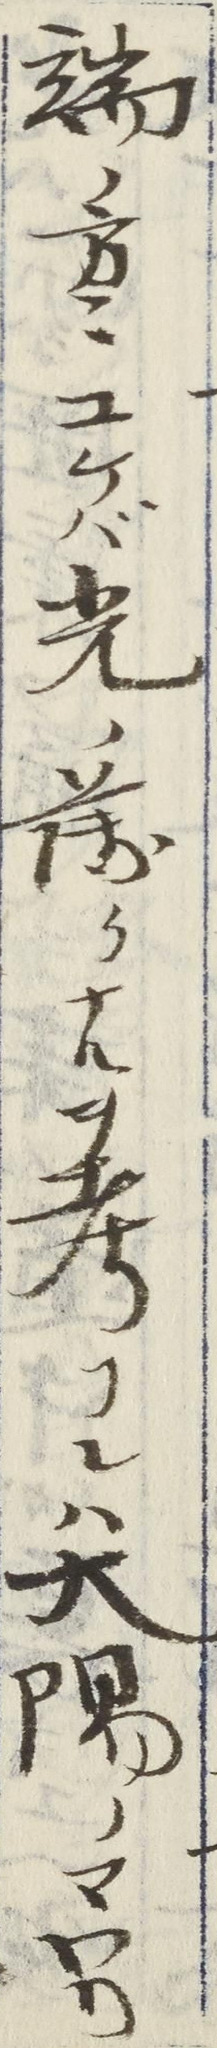端ノ方二ユヶバ光ノ薄クナルヲ考フレハ太陽ノマワリ
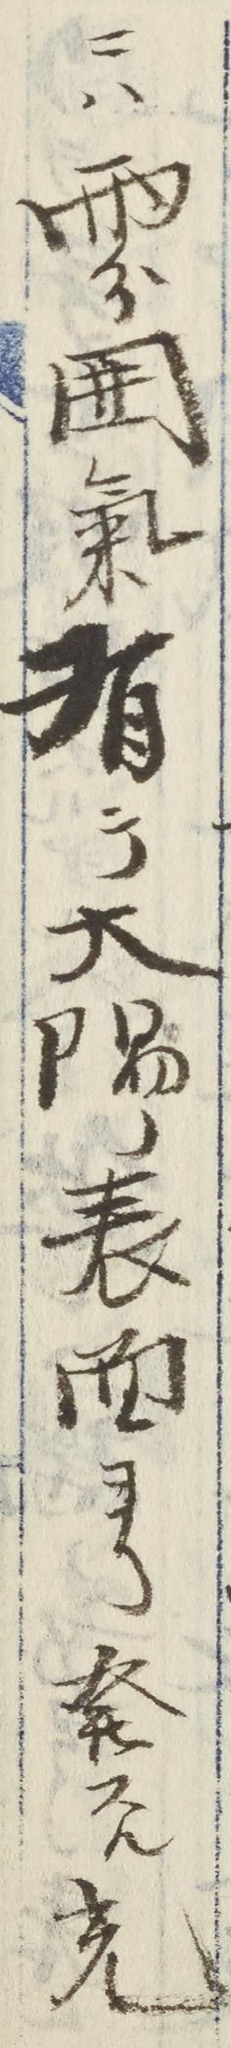二ハ雰囲気有テ太陽ノ表面ヨり発スル光

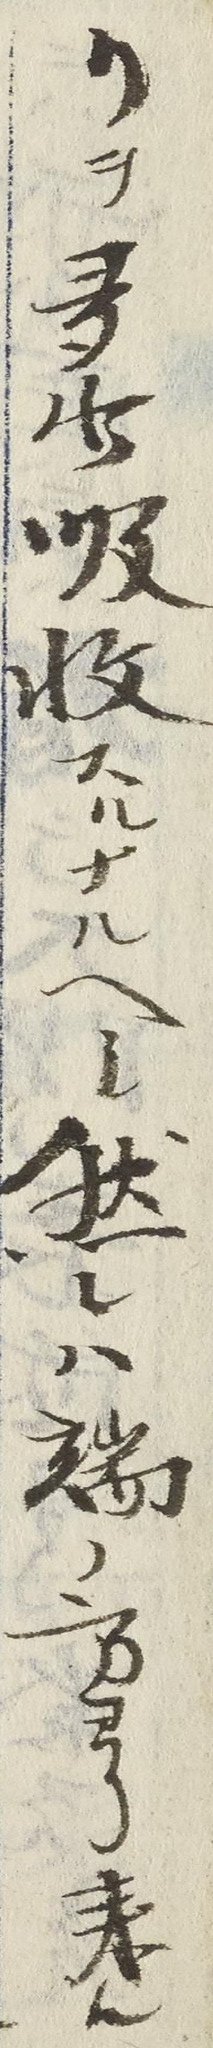リヲ多少吸収スルナルへし然レハ端ノ方ヨリ来ㇽ
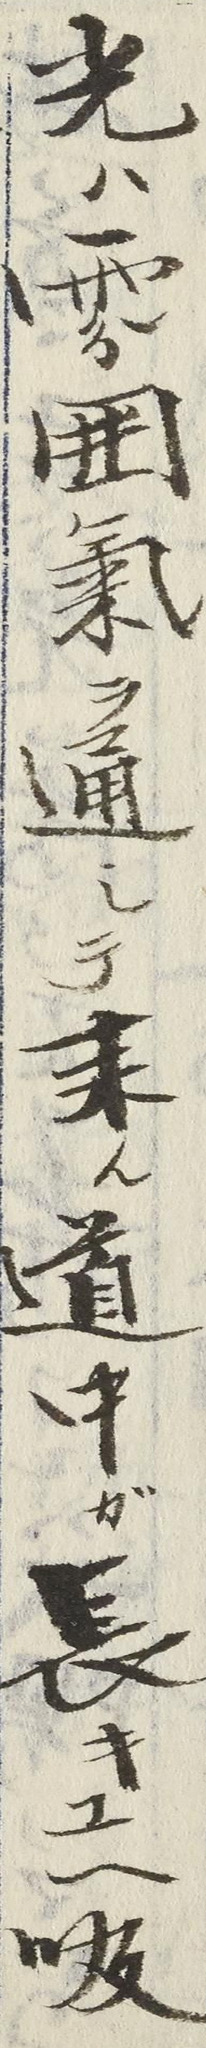光ハ雰囲気ヲ通しテ来ㇽ道中ガ長キユへ吸
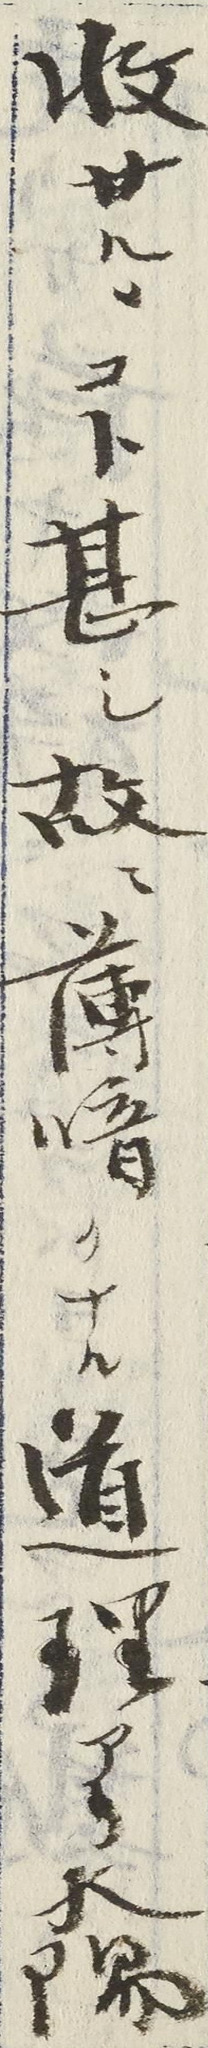収サルゝコト甚し故二薄暗クナル道理アリ太陽
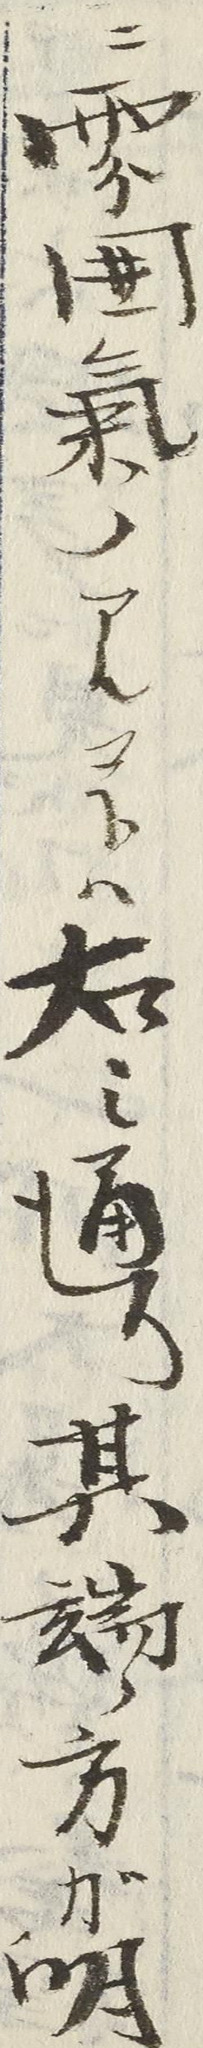二雰囲気ノアルコトハ右之通り其端ノ方が明
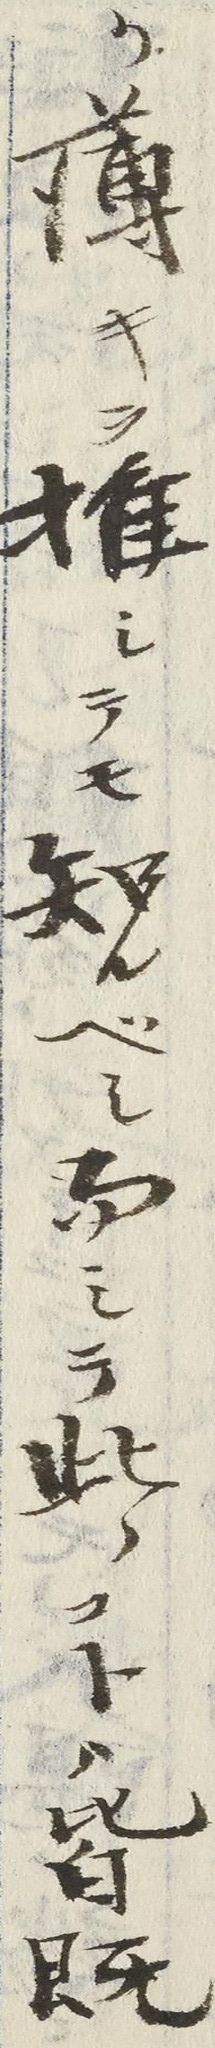り薄キヲ推しテモ知ㇽベシ而して此ノコトハ皆既
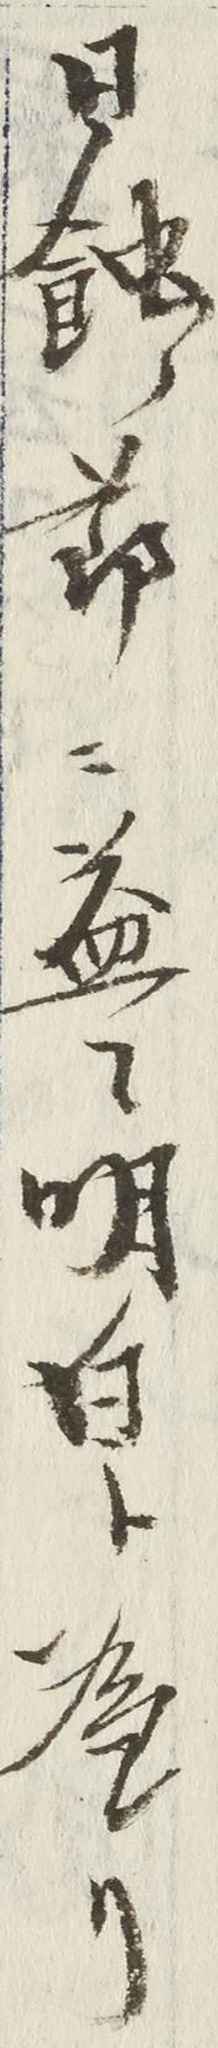日蝕ノ節二益々明白ㇳ為り
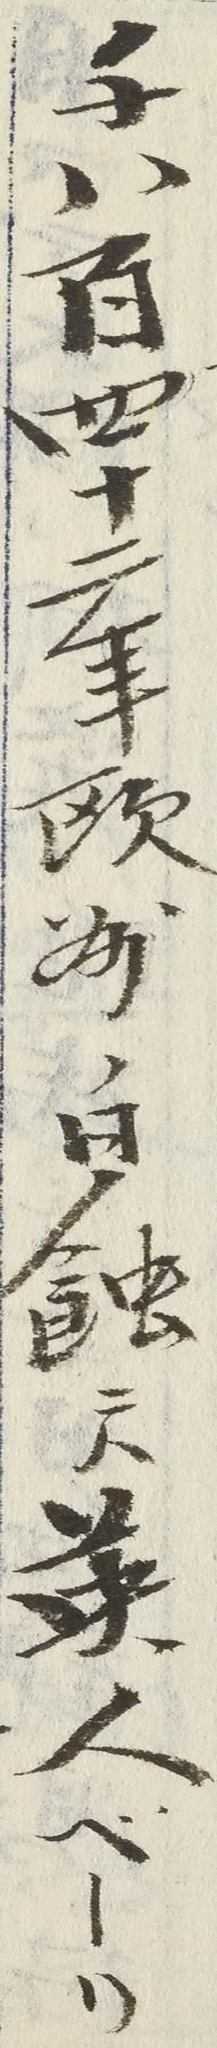千八百四十二年欧州ノ日蝕二ハ英人べーり
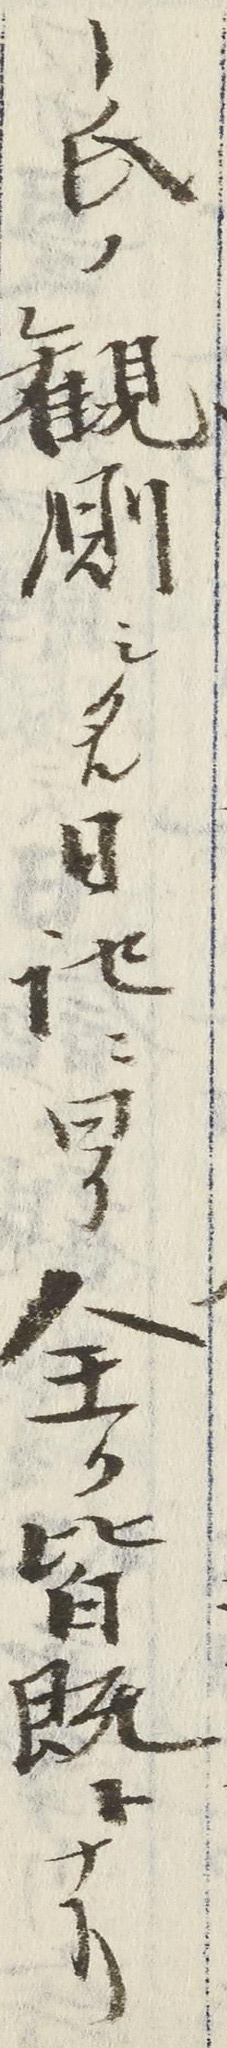ー氏ノ観測シタㇽ日記二曰ク全ク皆既トナリ
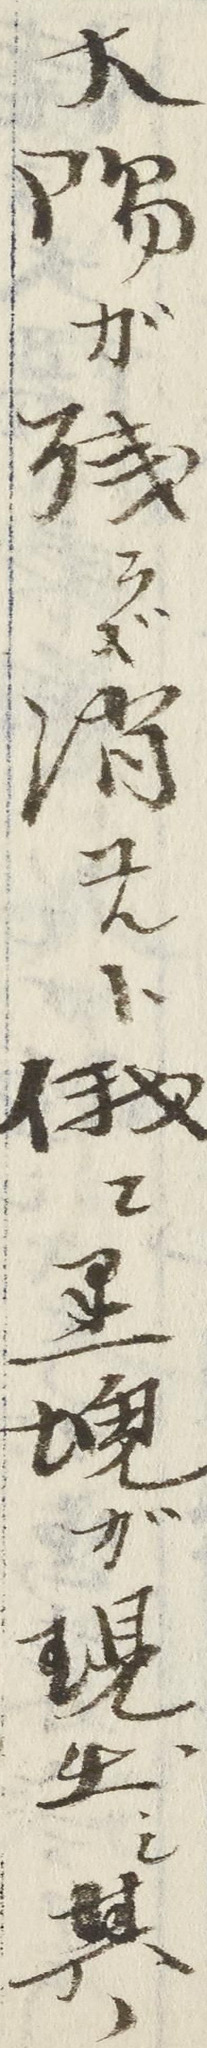太陽が残ラズ消ユㇽト俄二黒塊が現出し其ノ
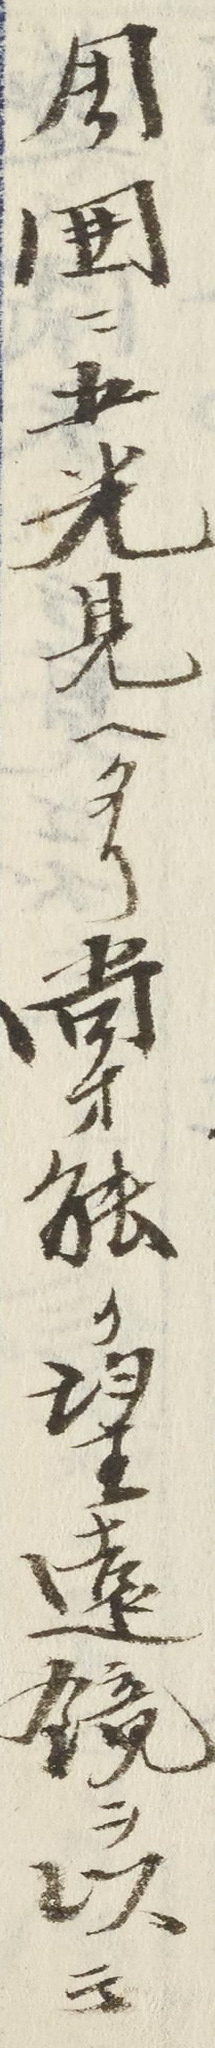周囲二五光見へタリ尚オ能ク望遠鏡ヲ以テ
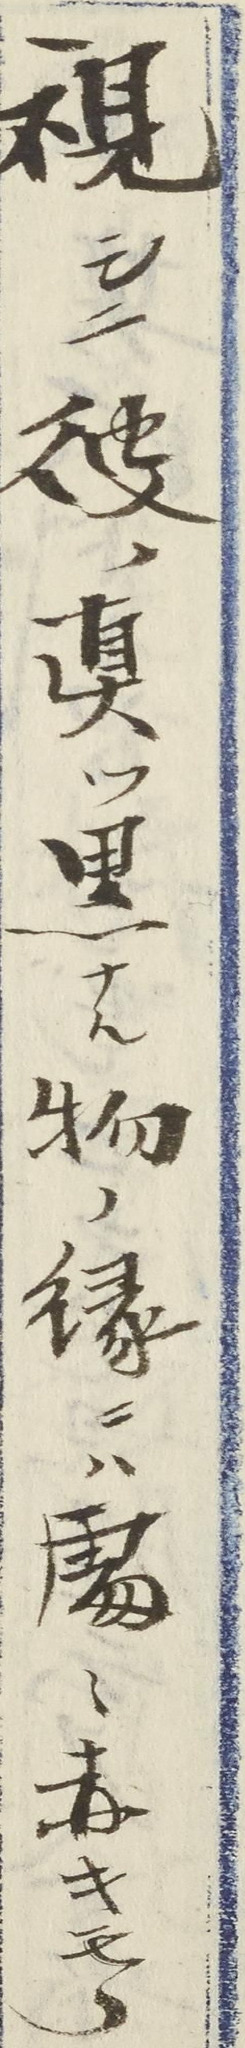視シ二彼ノ真ツ黒ナル物ノ縁二ハ処々赤キモノ
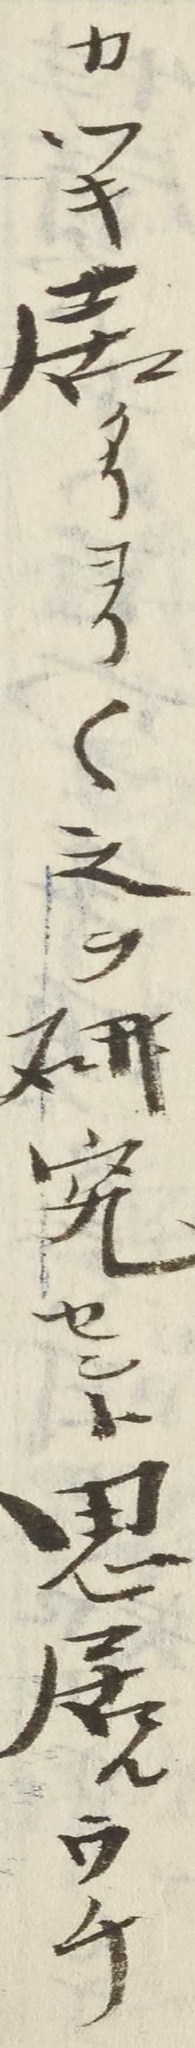カツキ居りしヨリ〳〵之ヲ研究セント思居ㇽウチ
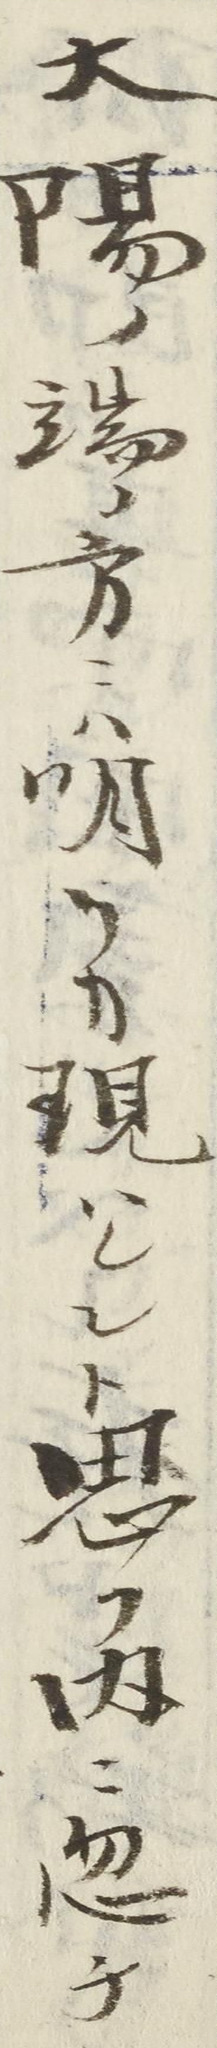太陽ノ端ノ方二ハ明りカ現ハレント思フ内二忽チ
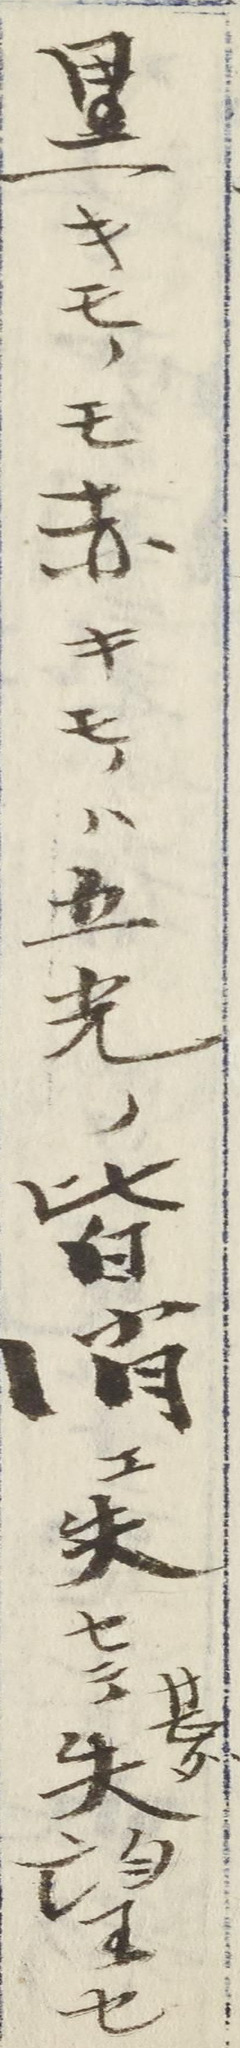黒キモノモ赤キモノハ五光ノ皆消エ失セテ甚ダ失望セ
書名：日蝕録　全
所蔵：東京大学地震研究所図書室 Earthquake Research Institute Library, The University of Tokyo, JAPAN
